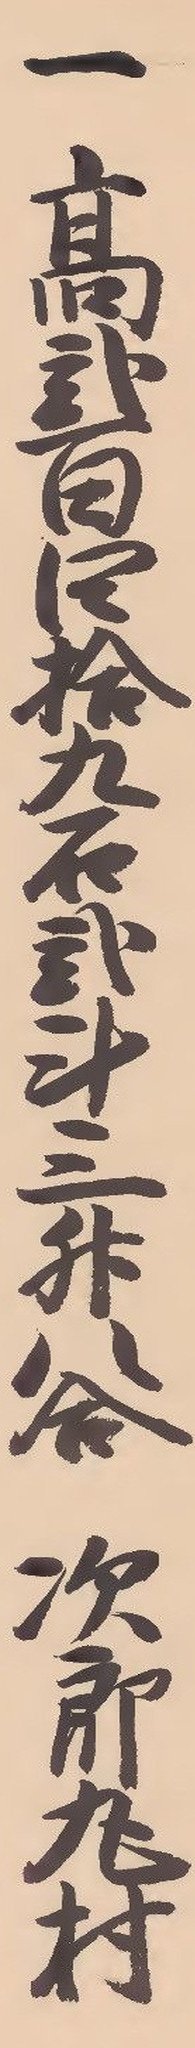一高弐百四拾九石弐斗三升八合次郎丸村
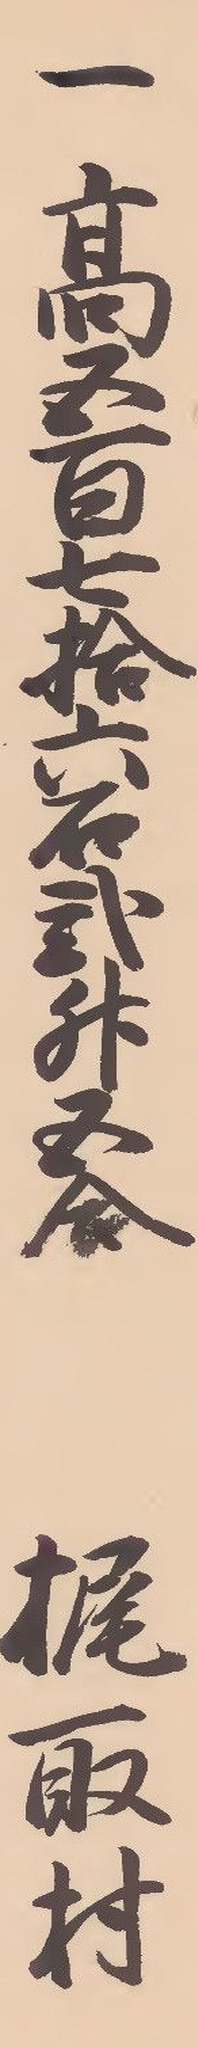一高五百七拾六石弐升五合梶取村
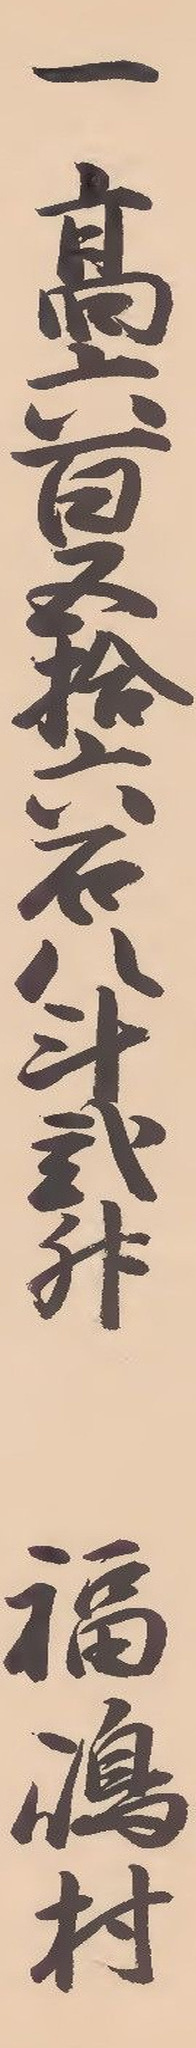一高六百五拾六石八斗弐升福島村
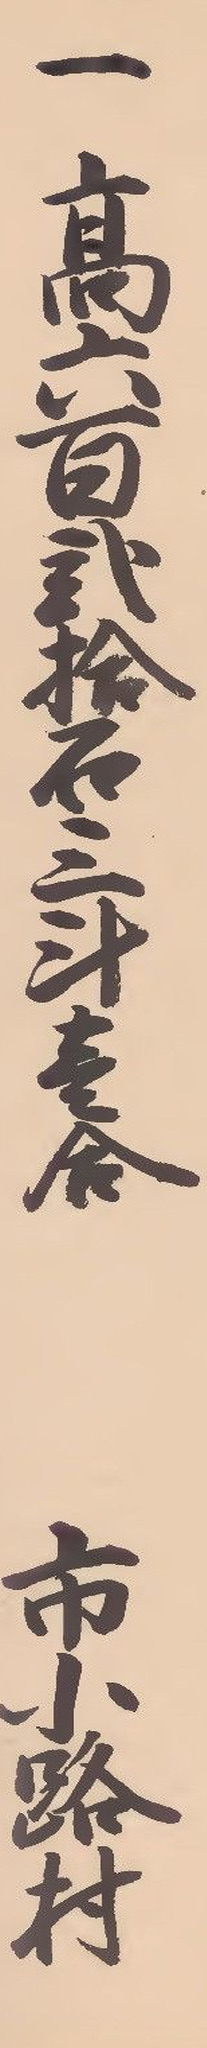一高六百弐拾石三斗壱合市小路村
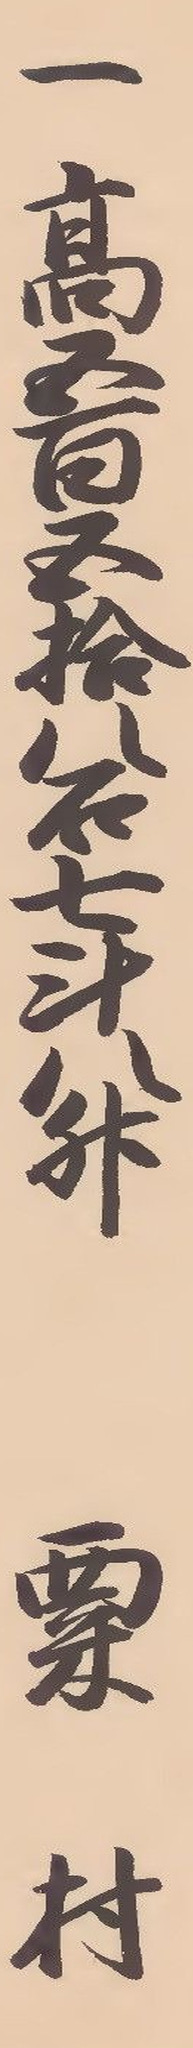一高五百五拾八石七斗八升粟村
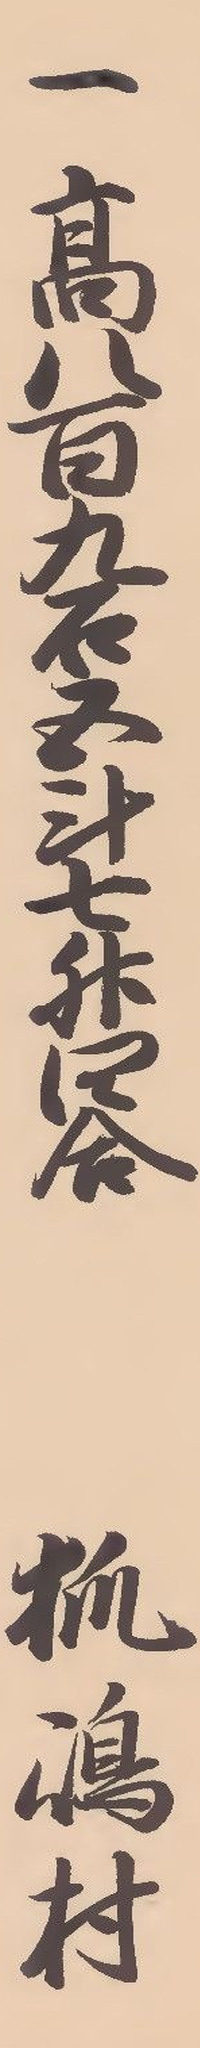一高八百九石五斗七升四合狐島村
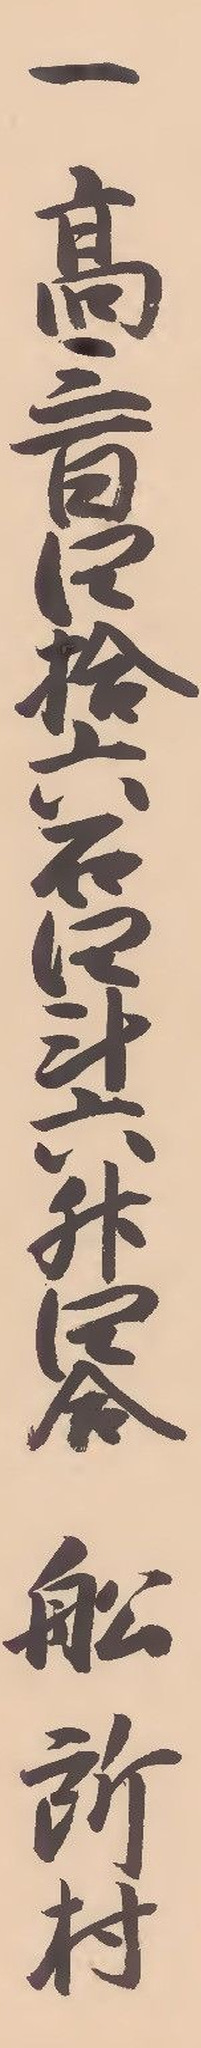一高三百四拾六石四斗六升四合船所村

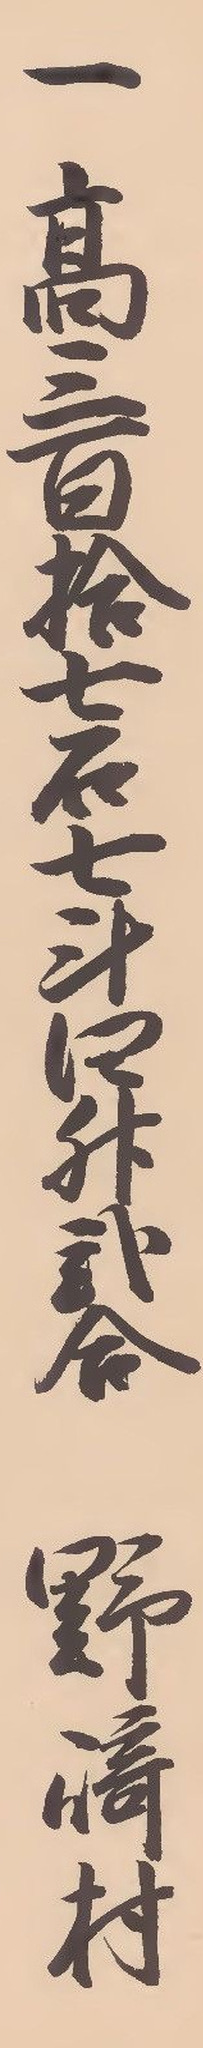一高三百拾七石七斗四升弐合野崎村
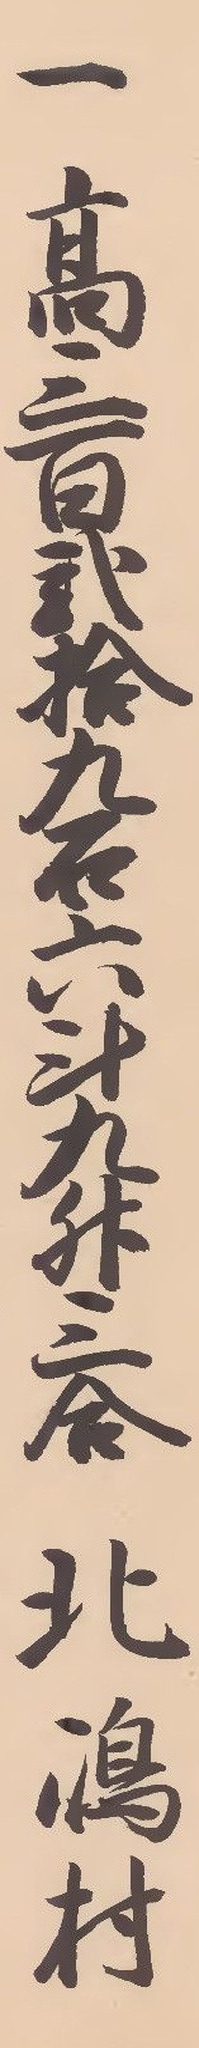一高三百弐拾九石六斗九升三合北島村
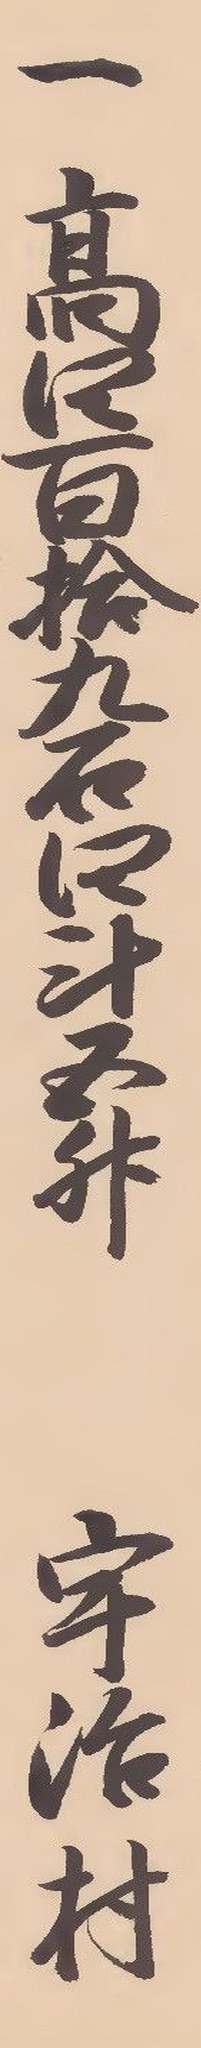一高四百拾九石四斗五升宇治村
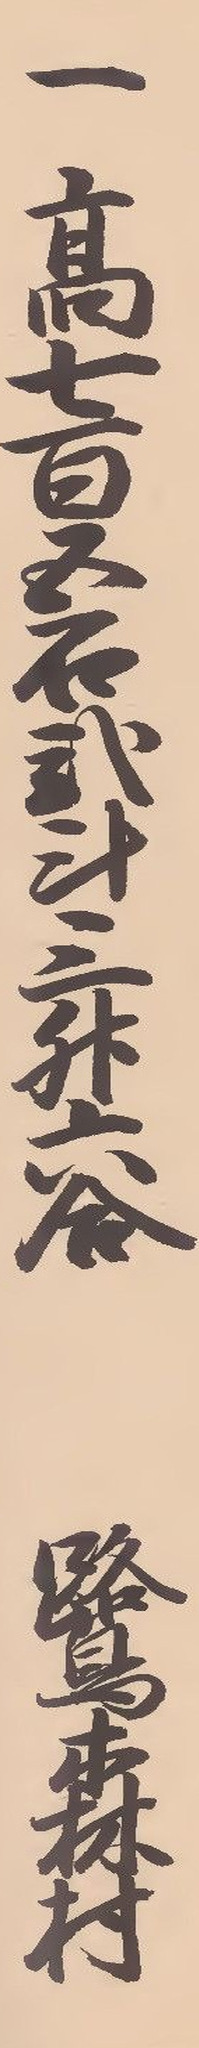一高七百五石弐斗三升六合鷺森村
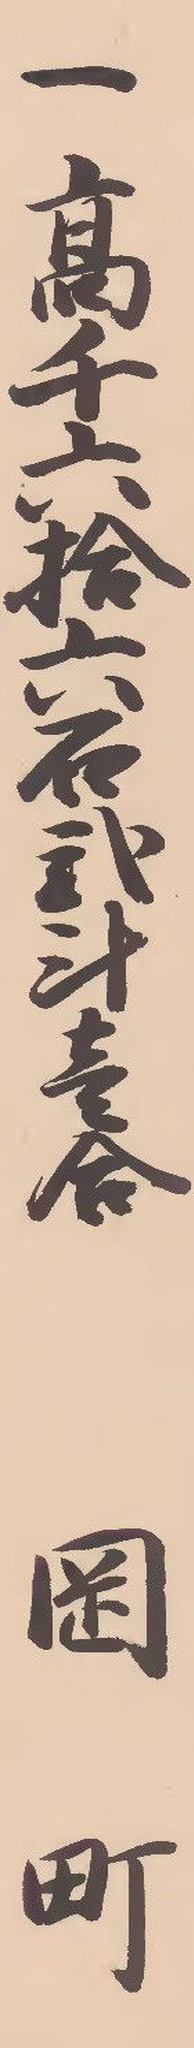一高千六拾六石弐斗壱合岡町
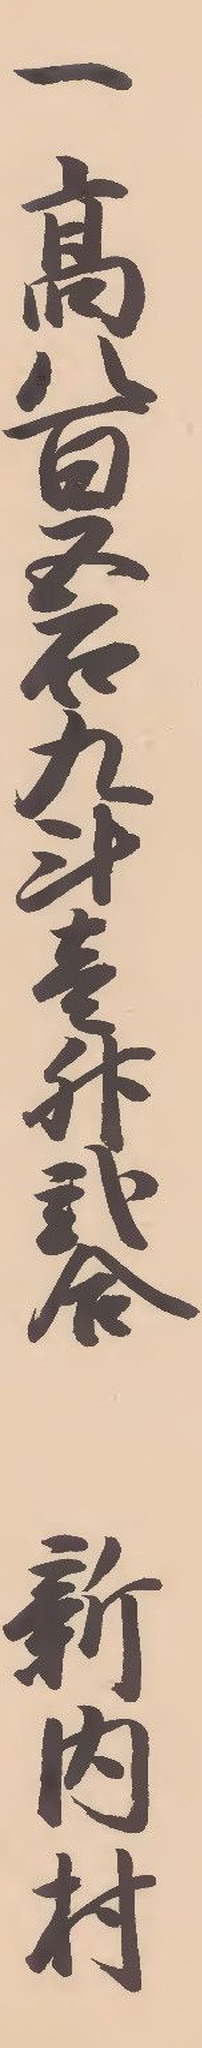一高八百五石九斗壱升弐合新内村
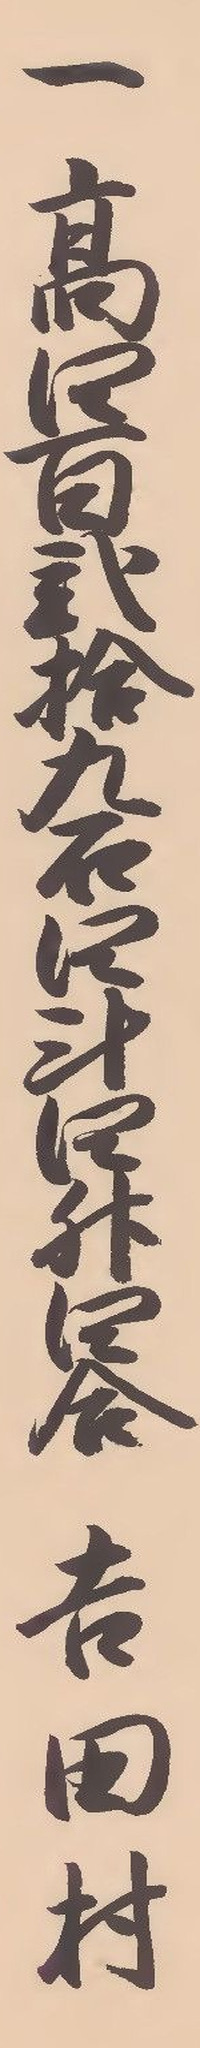一高四百弐拾九石四斗四升四合吉田村
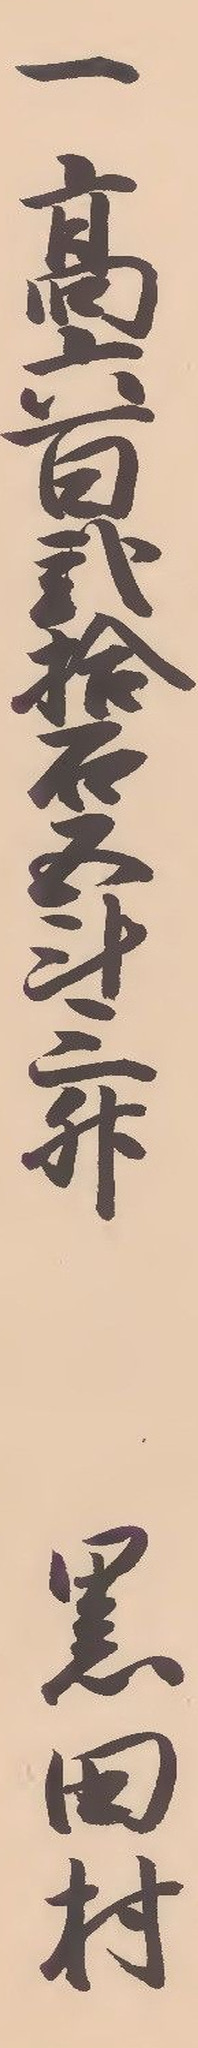一高六百弐拾石五斗三升黒田村

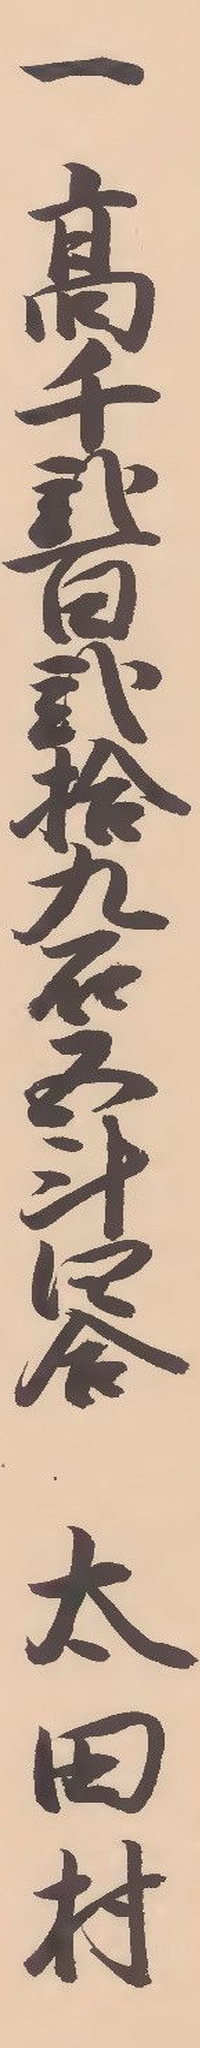一高千弐百弐拾九石五斗四合太田村
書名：紀伊国郷帳
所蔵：国立公文書館 National Archives of Japan
